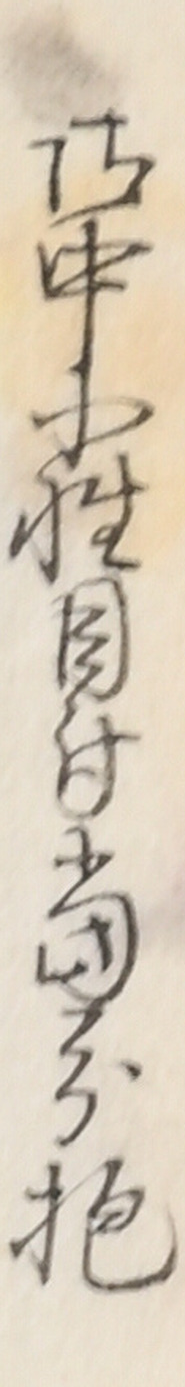御中小性目付当分抱
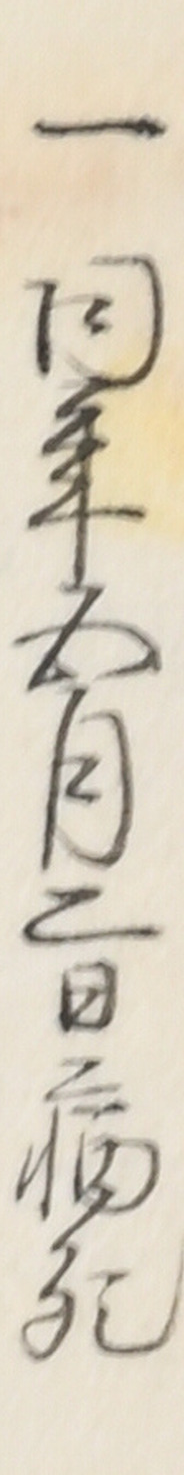一同年五月二日病死
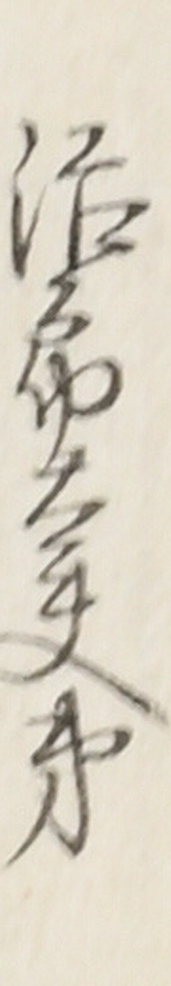治郎太夫弟
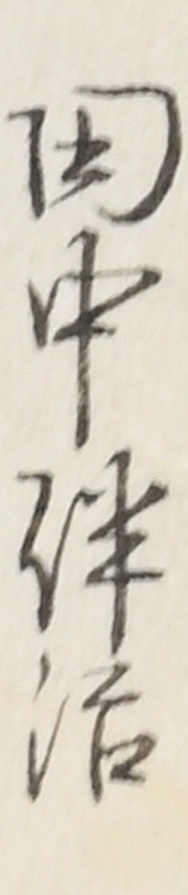田中判治
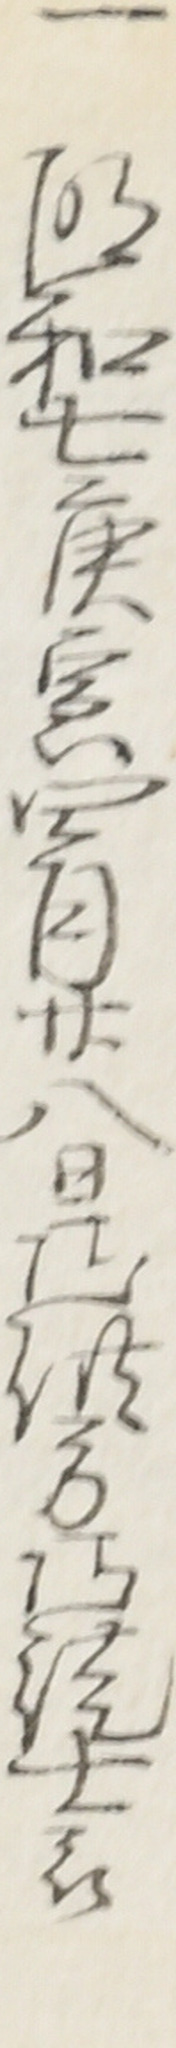一明和七庚寅四月廿八日御供方御徒士被
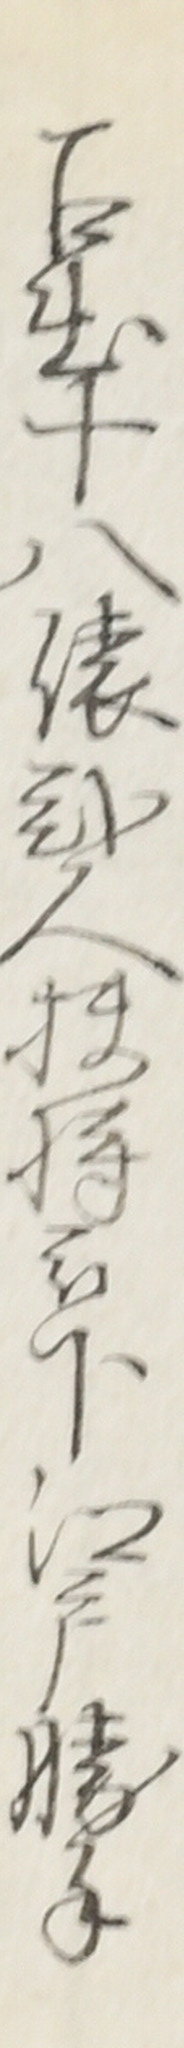召出十八俵弐人扶持被下江戸勝手
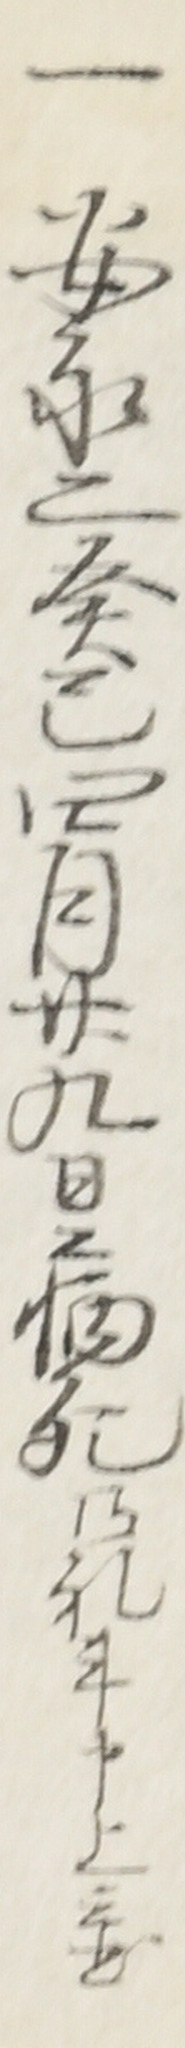一安永二癸巳四月廿九日病死御礼書申上置
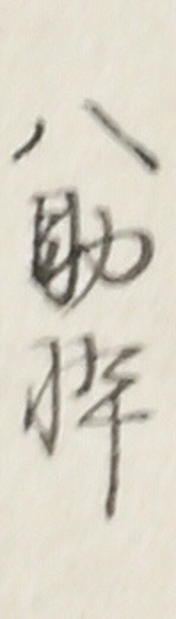八助忰
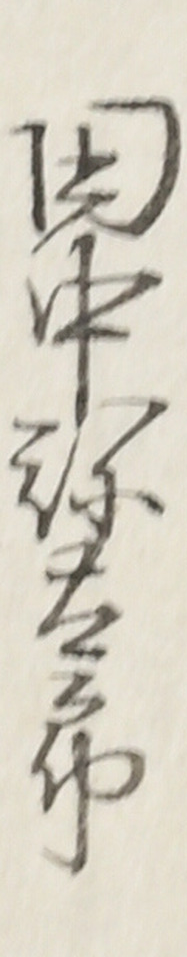田中弥太郎
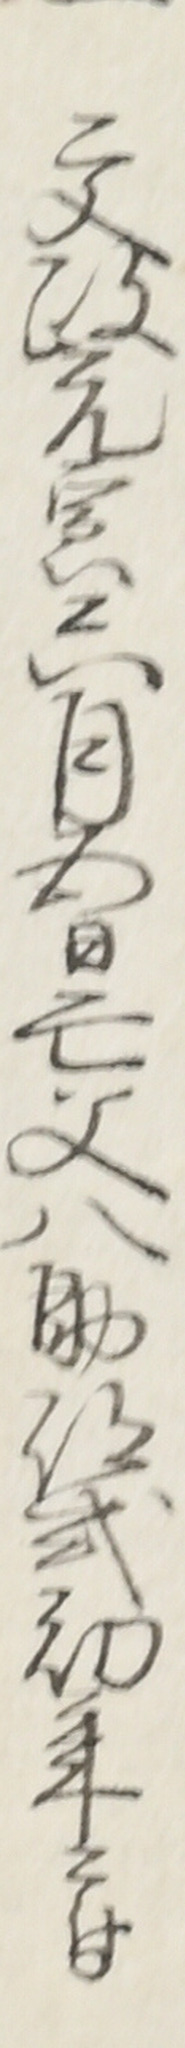一文政元寅六月五日亡父八助跡式幼年に付
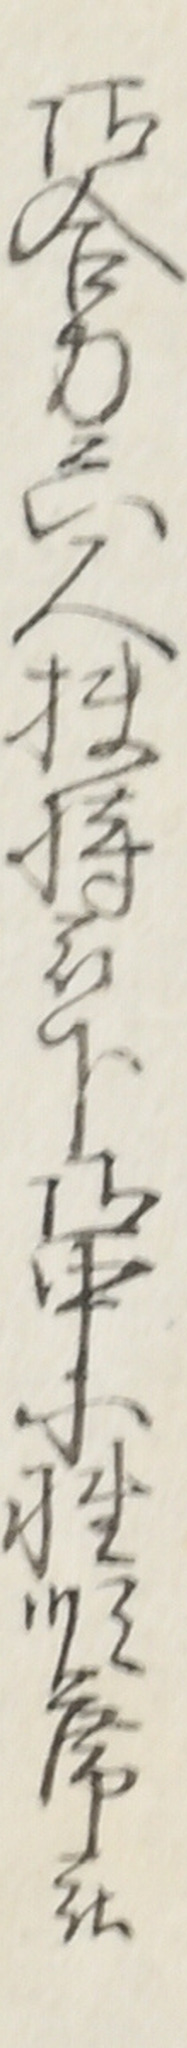御合力六人扶持被下御中小性順席被
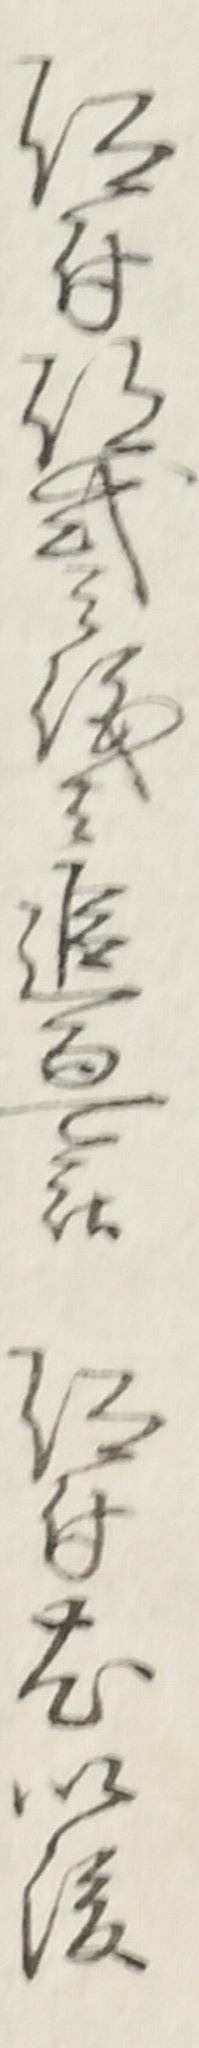仰付跡式之儀は追而可被仰付尤以後
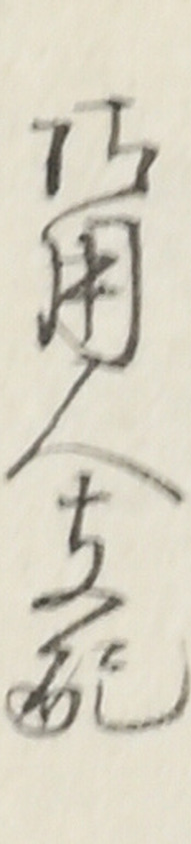御用人支配
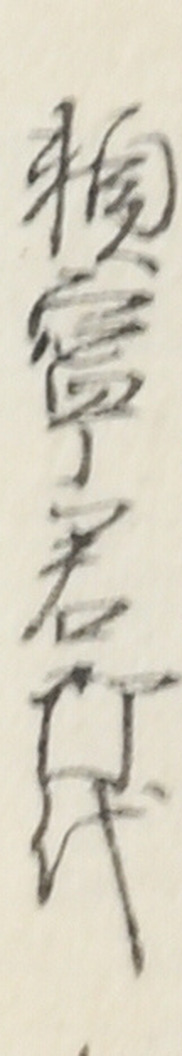頼寧君御代

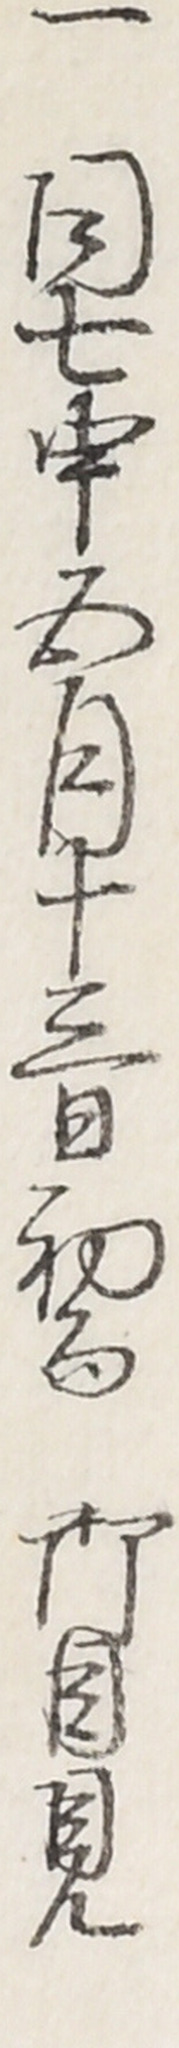一同七申五月十三日初而御目見
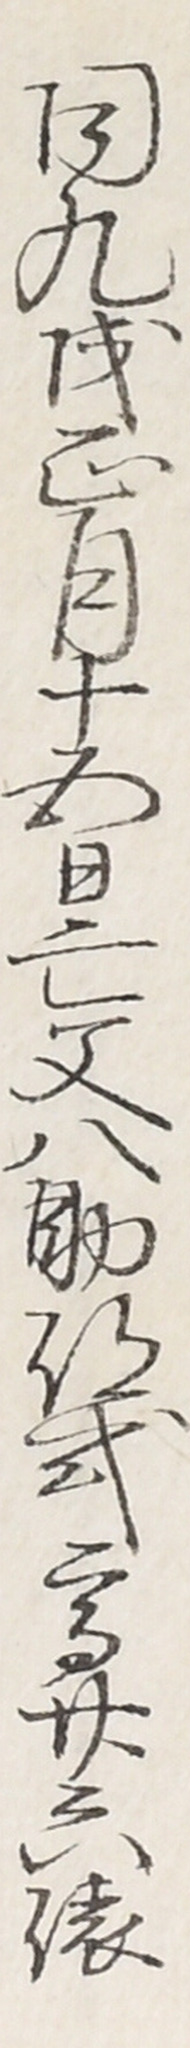一同九戌正月十五日亡父八助跡式高廿六俵
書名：給人諸士勤仕録（七）
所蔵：伊那市立高遠町図書館・合同会社AMANE
